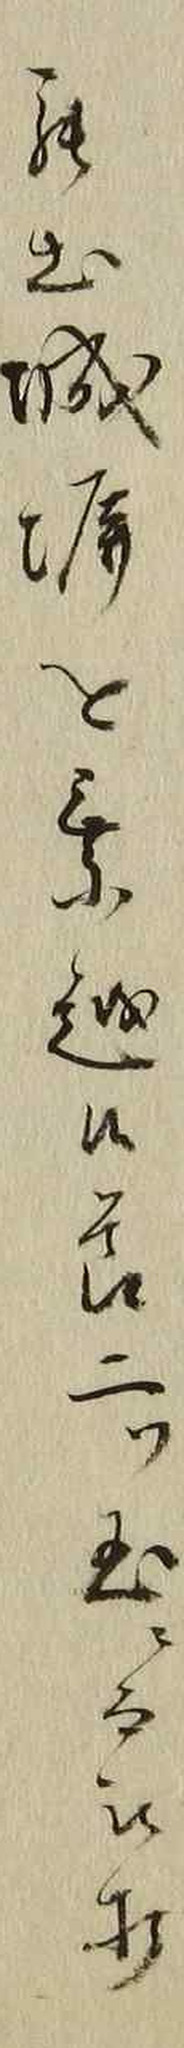罷出城塀を乗越候節二ツ玉ニ而被打
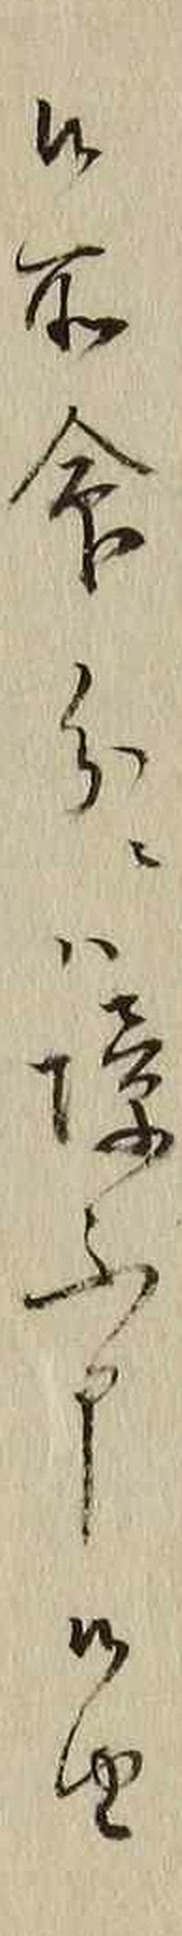候所命分ニハ障不申候由
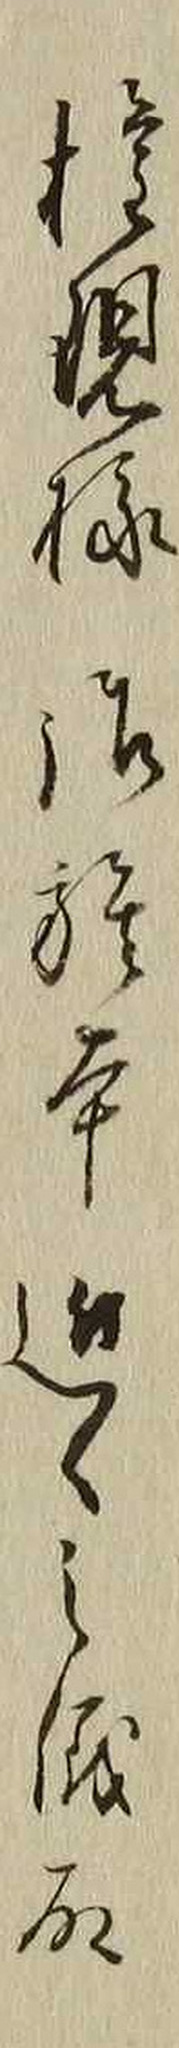権現様御旗本近く之儀故
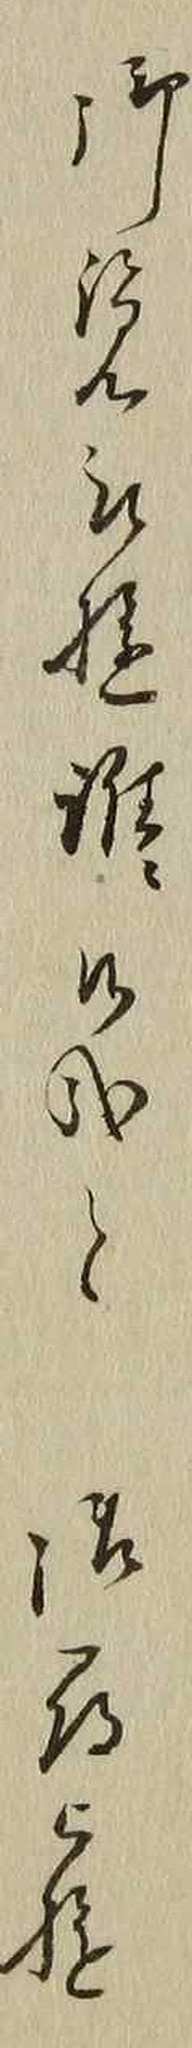御覧被遊誰ニ候哉と御尋被遊
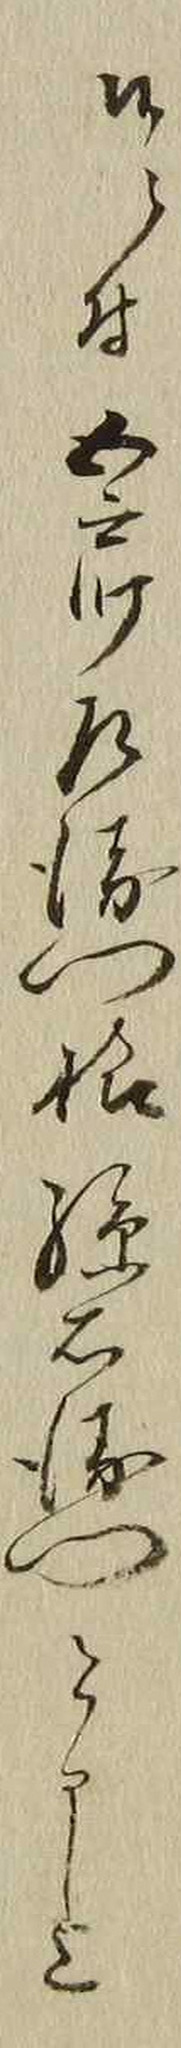候ニ付五郎左衛門様孫右衛門と申上
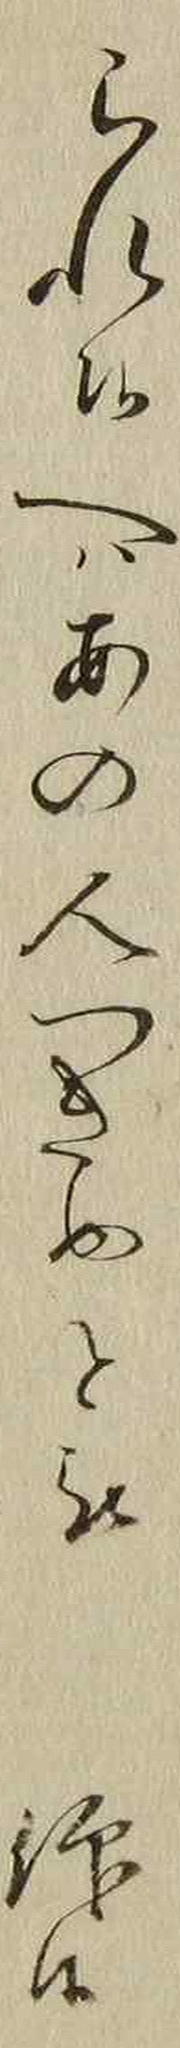られ候ヘハあの人つきめと被仰候
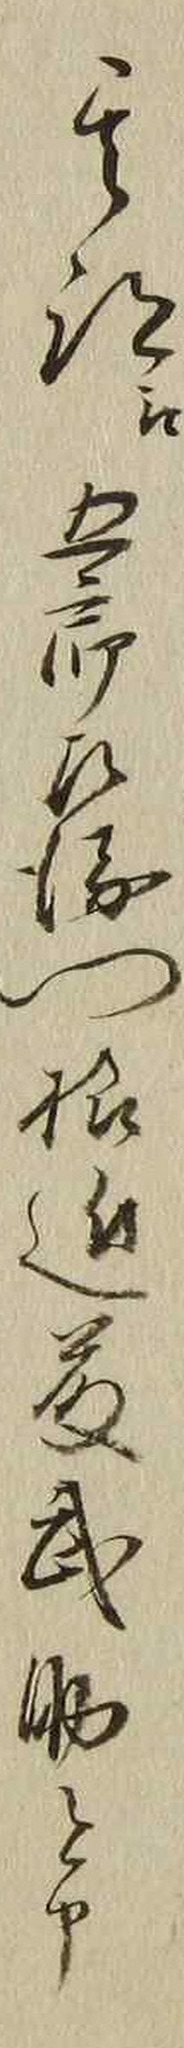其跡江五郎左衛門様近藤武助と申
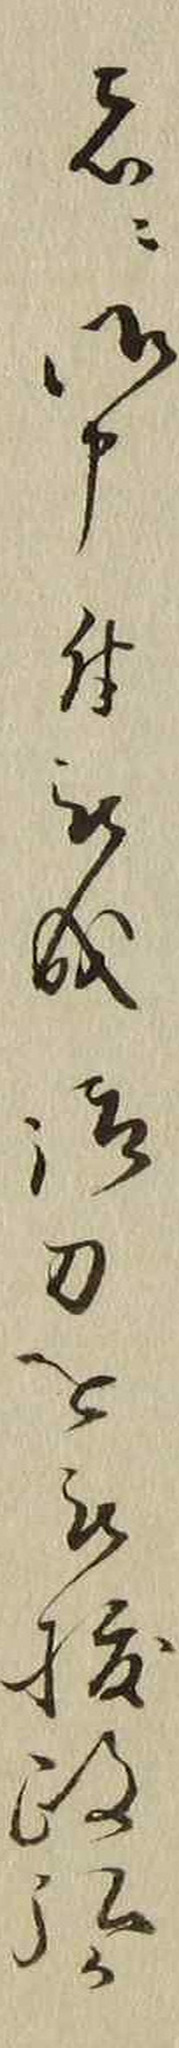者ニ御申付被成御刀を被抜政弘之
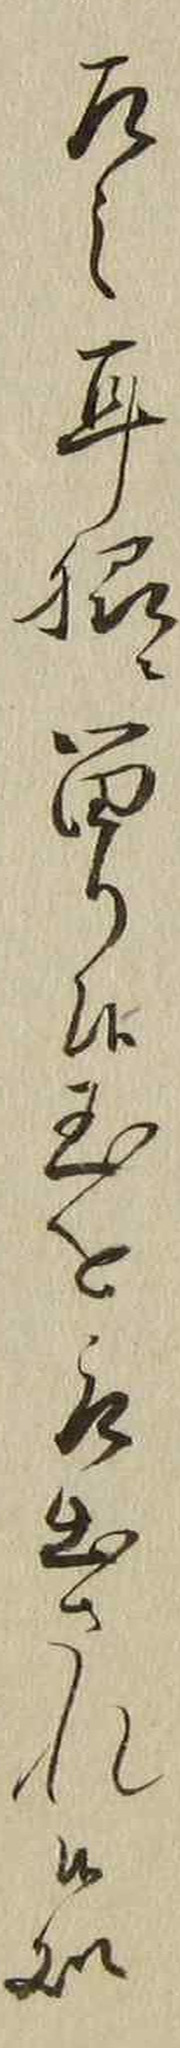左之耳脇ニ留り候玉を取出され候処
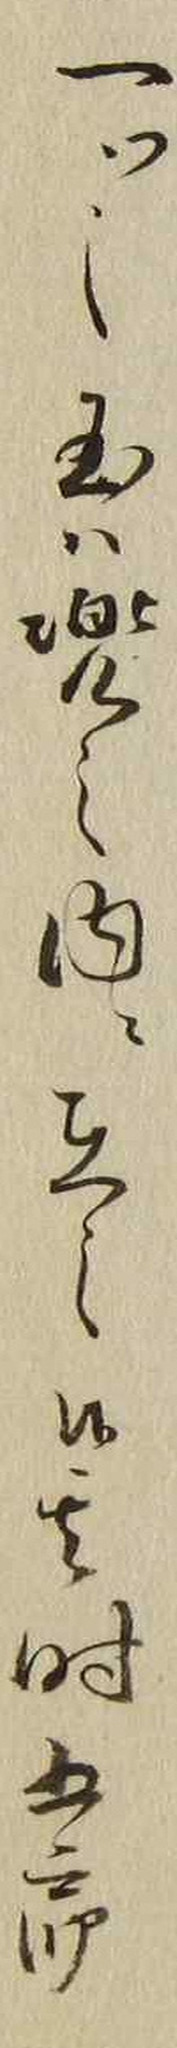一ツ之玉ハ兜之内ニ在之候其時五郎
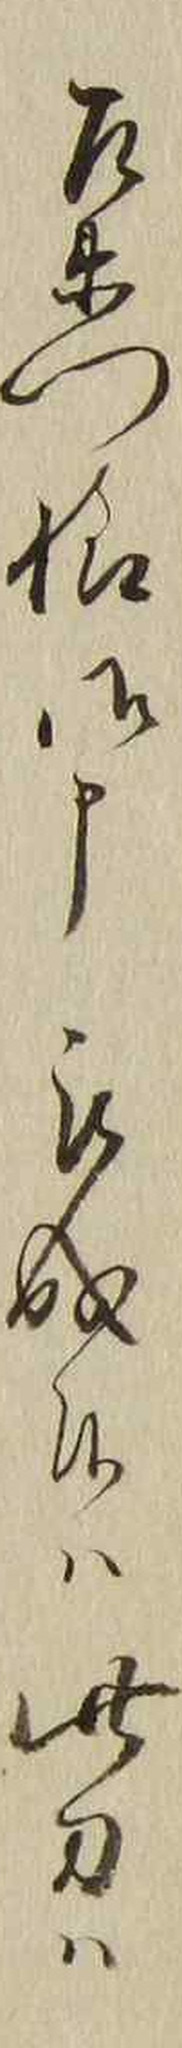左衛門様御申被成候ハ此刀ハ
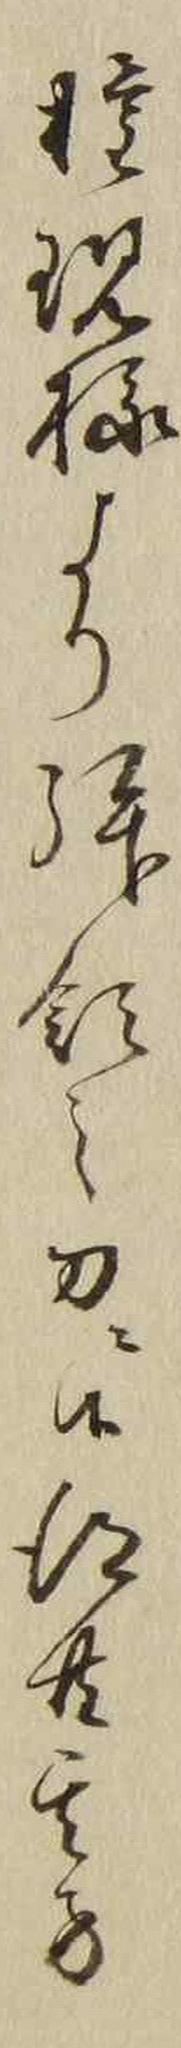権現様より拝領之刀ニ候得共其方

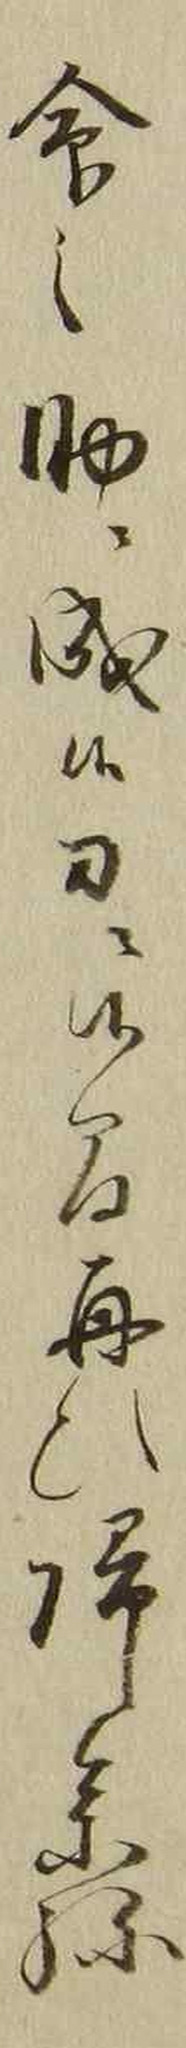命之助ニ成候刀ニ候間再ひ帰参弥
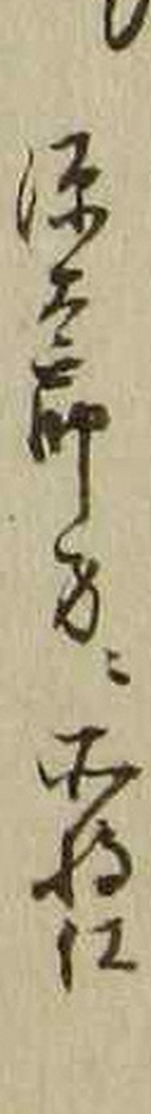孫太郎方ニ所持仕
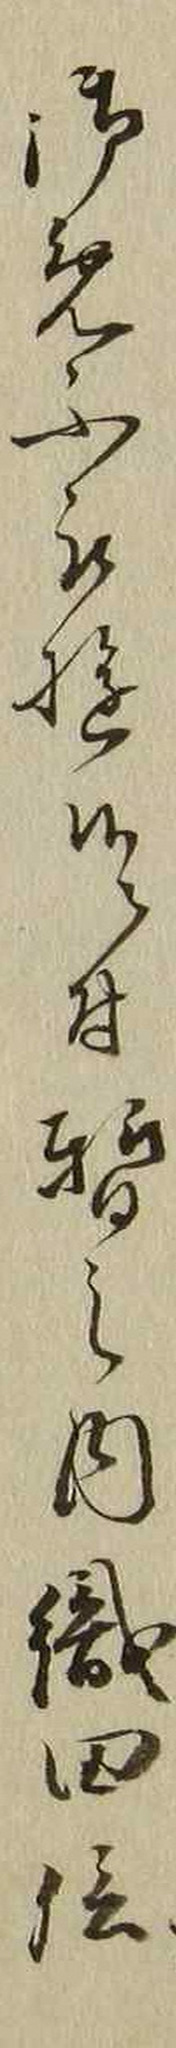御免不被遊候ニ付暫之内織田信
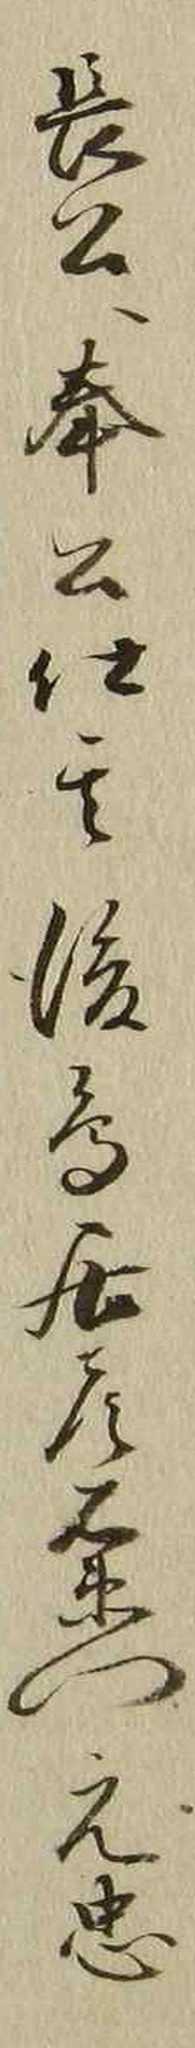長公ヘ奉公仕其後鳥居彦右衛門元忠
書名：諸士系譜　巻之68　を之部2
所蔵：会津若松市立会津図書館
